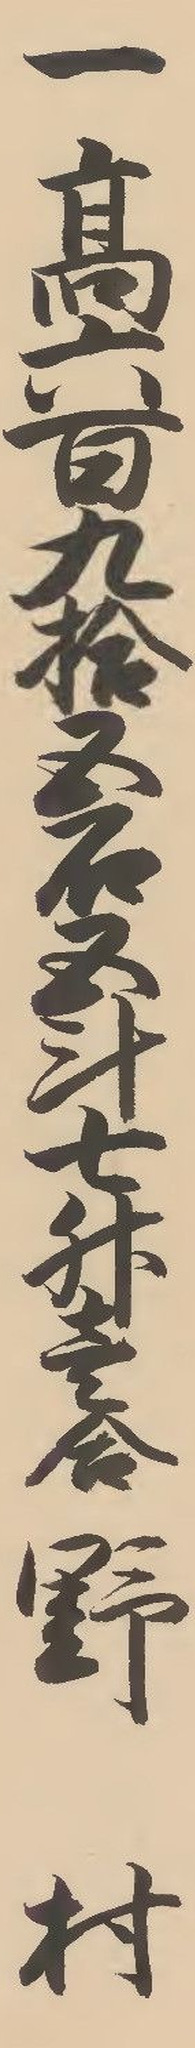一髙六百九拾五石五斗七升壱合野村

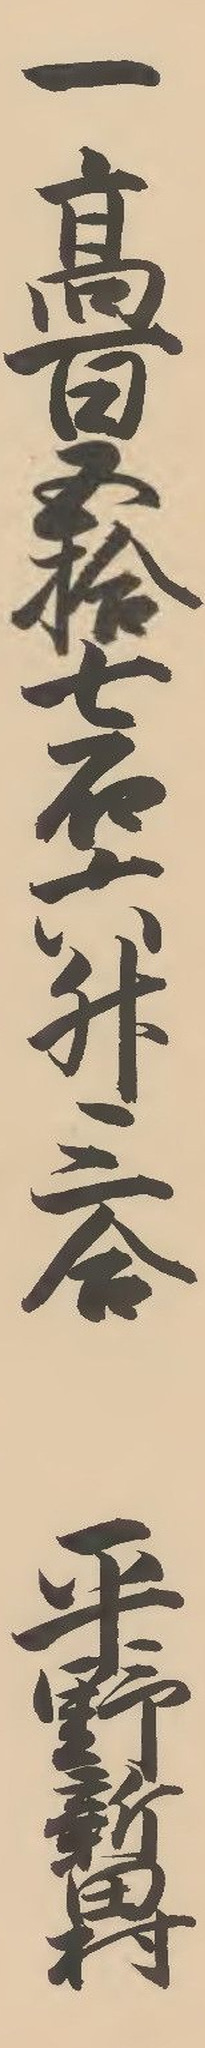一髙百五拾七石六升三合平野新田村
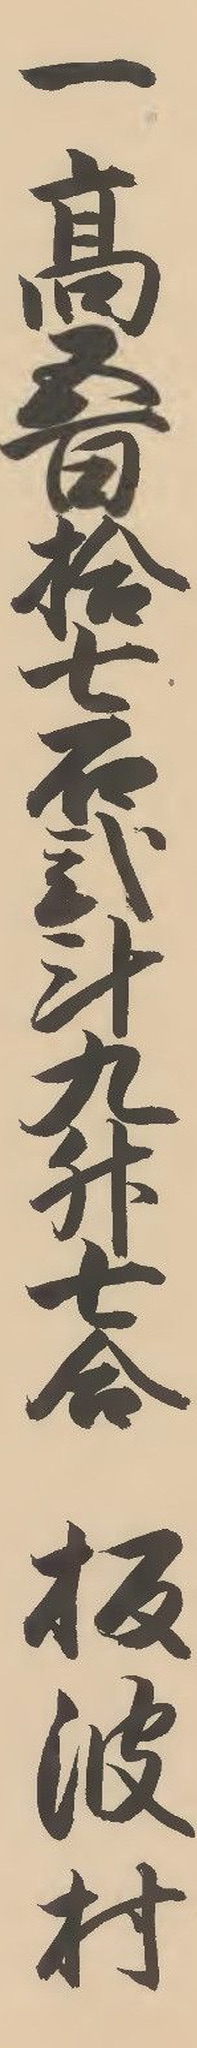一髙五百拾七石弐斗九升七合板波村
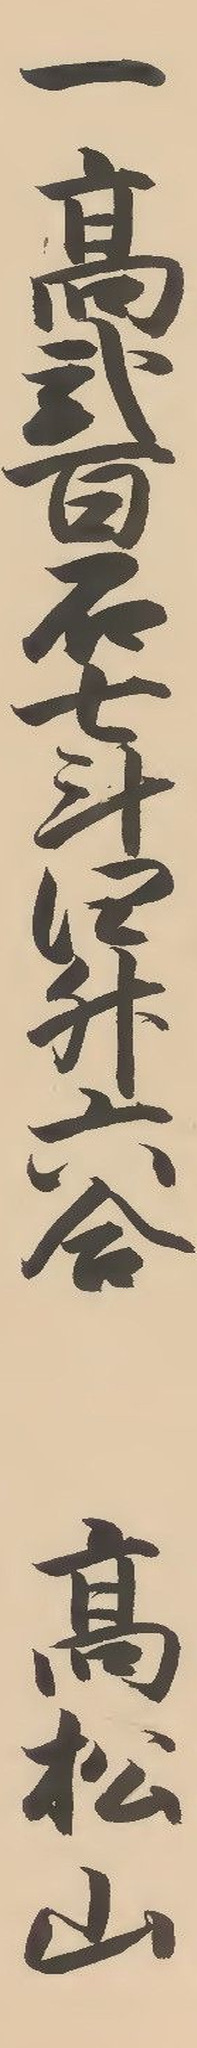一髙弐百石七斗四升六合髙松山
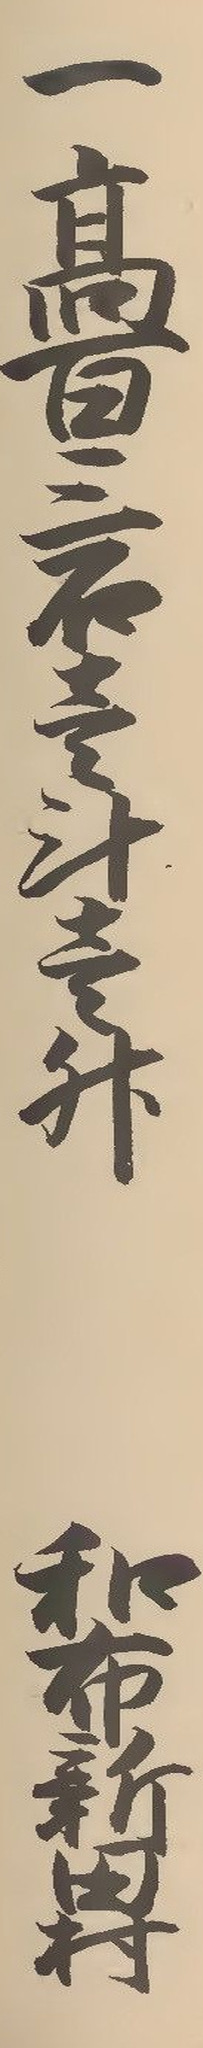一髙百三石壱斗壱升和布新田村
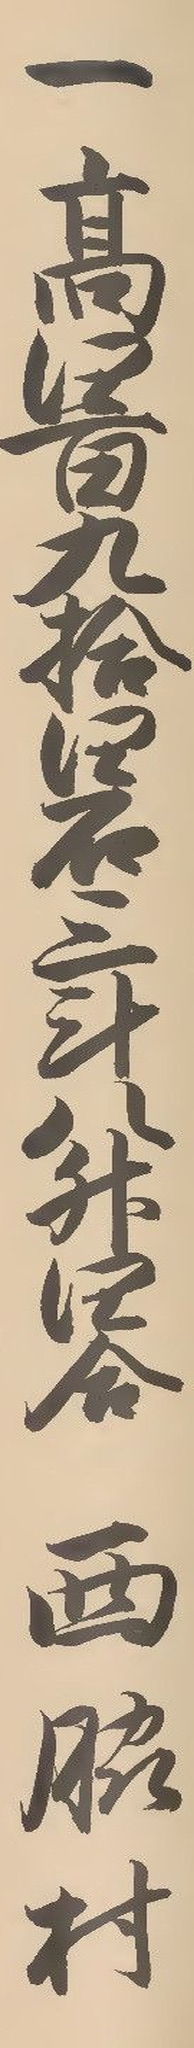一髙四百九拾四石三斗八升四合西脇村
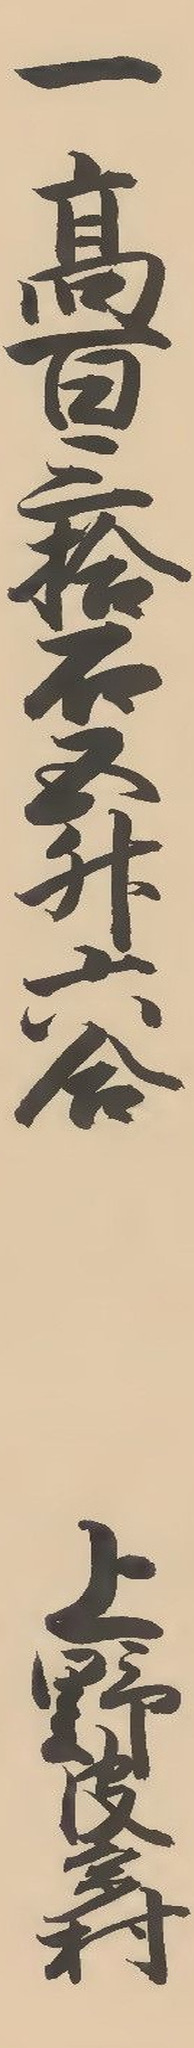一髙百三拾石五升六合上野皮多村
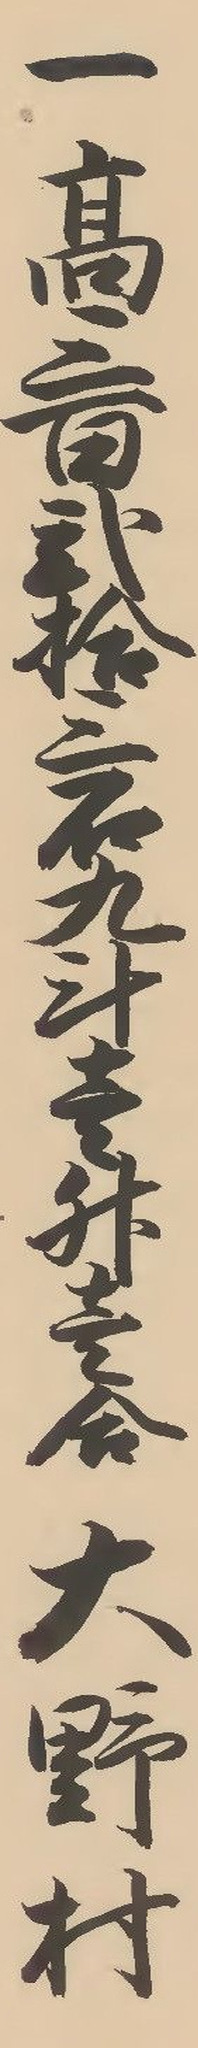一髙三百弐拾三石九斗壱升壱合大野村
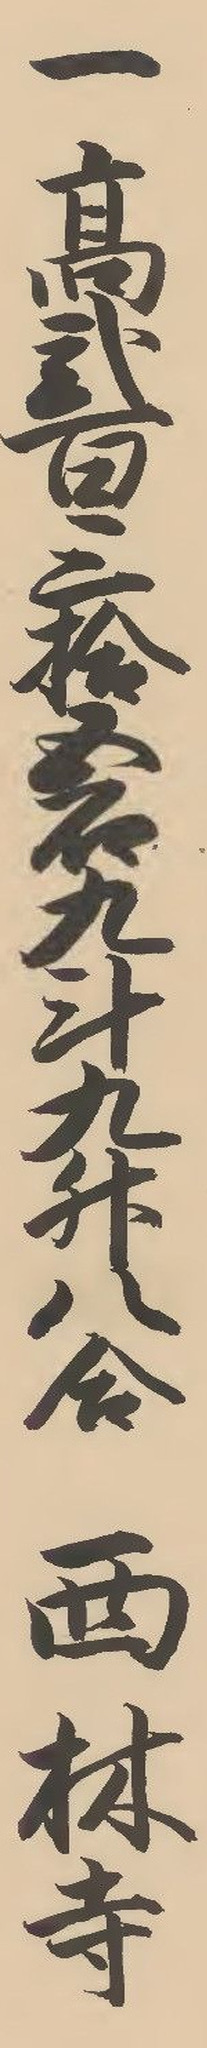一髙弐百三拾五石九斗九升八合西林寺

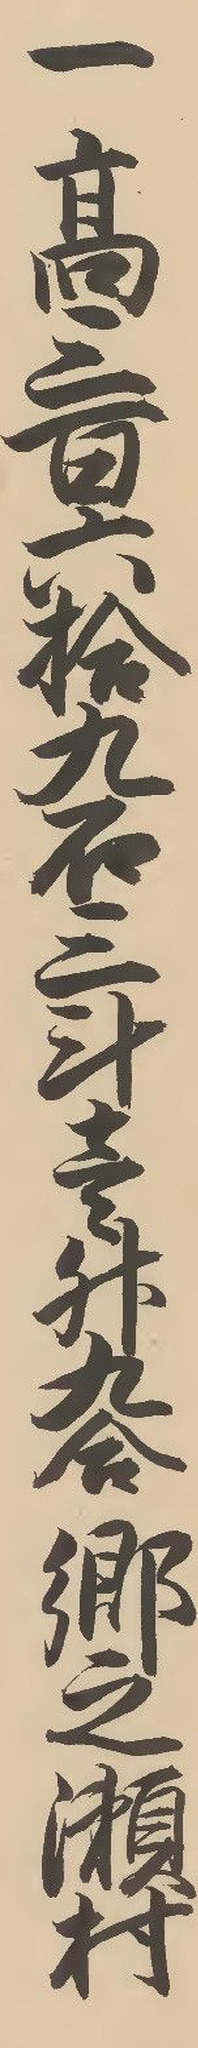一髙三百六拾九石三斗壱升九合郷之瀬村
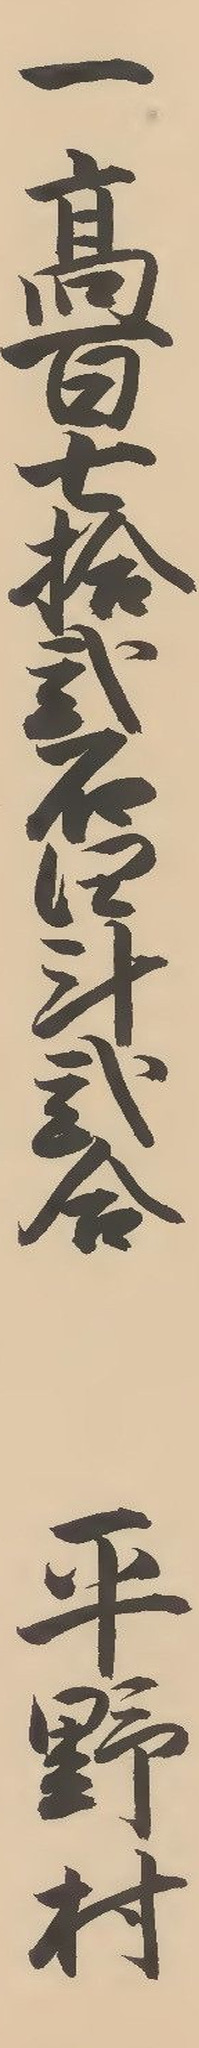一髙百七拾弐石四斗弐合平野村
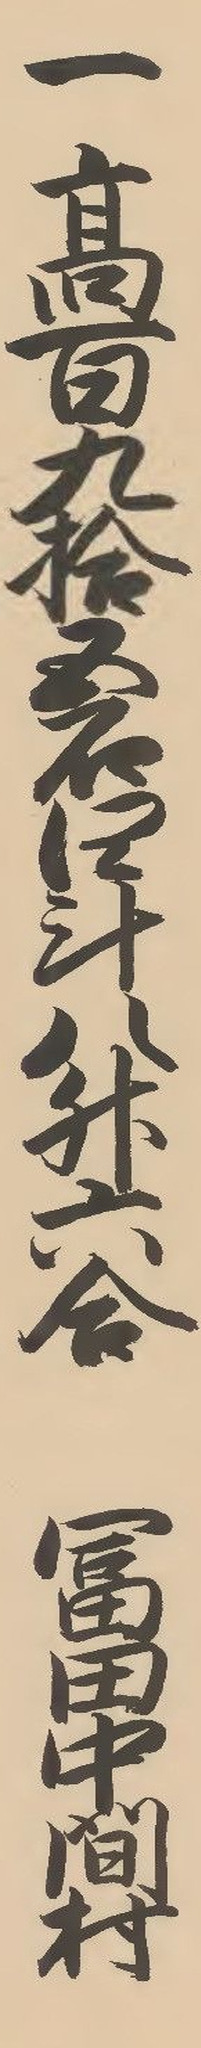一髙百九拾五石四斗八升六合冨田中間村
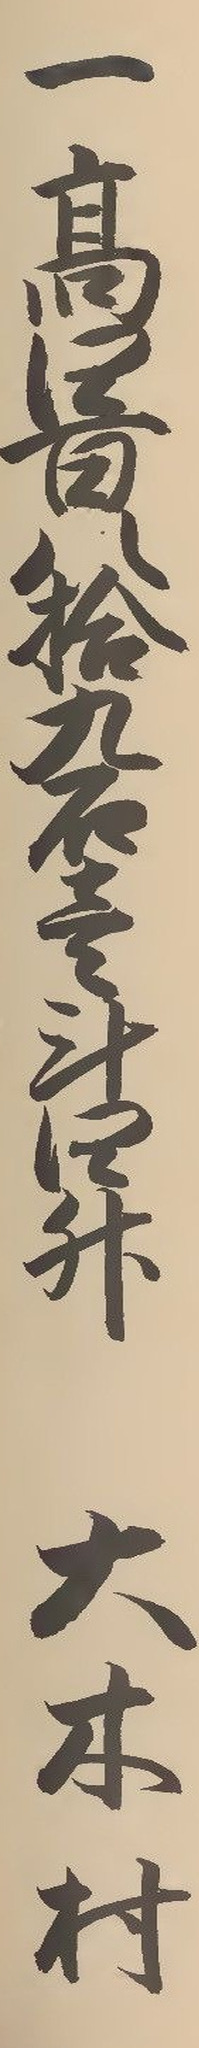一髙四百八拾九石壱斗四升大木村
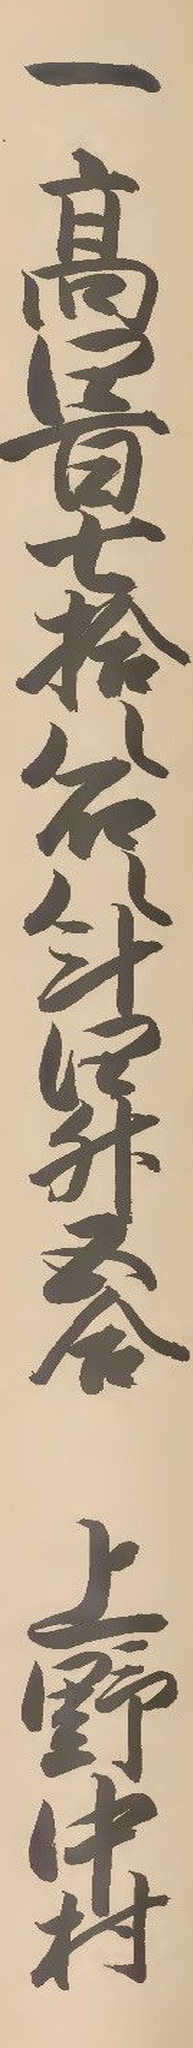一髙四百七拾八石八斗四升五合上野中村
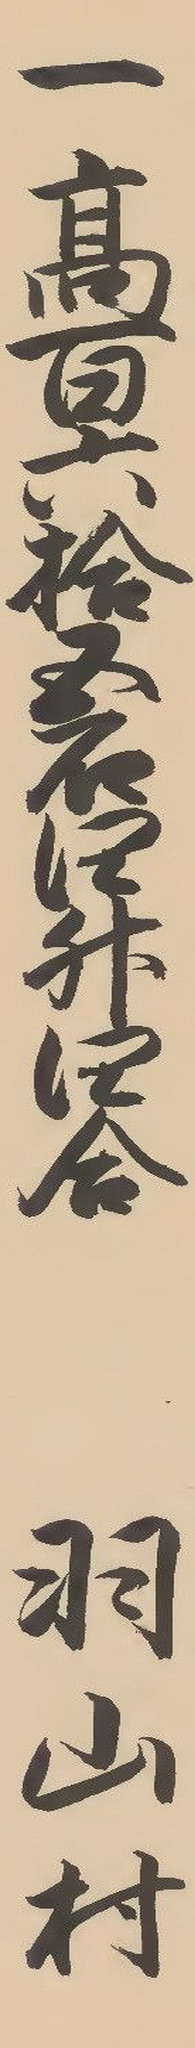一髙百六拾五石四升四合羽山村
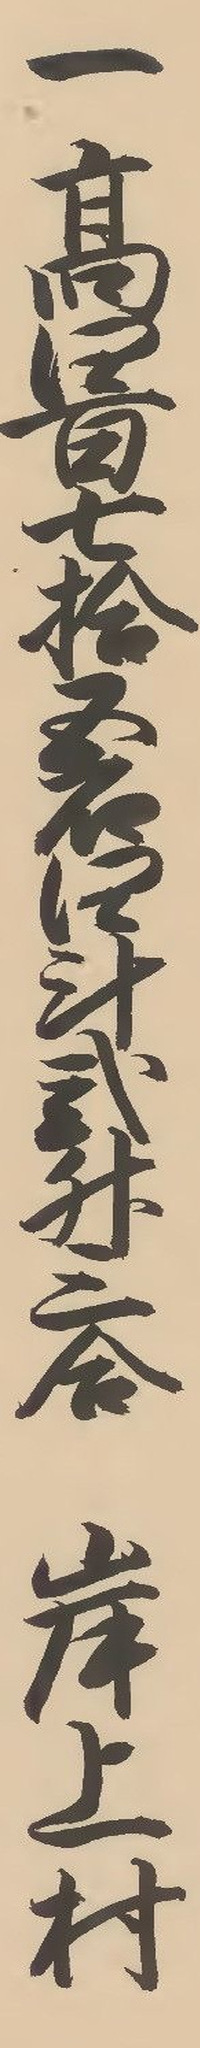一髙四百七拾五石四斗弐升三合岸上村
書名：播磨国郷帳
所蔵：国立公文書館 National Archives of Japan
